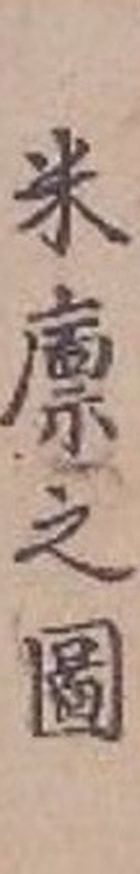米廩之図

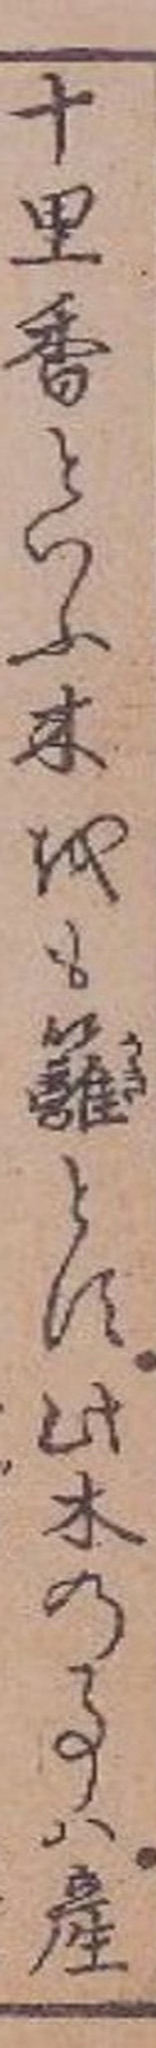十里香といふ木をも籬とす•此木の事は•産
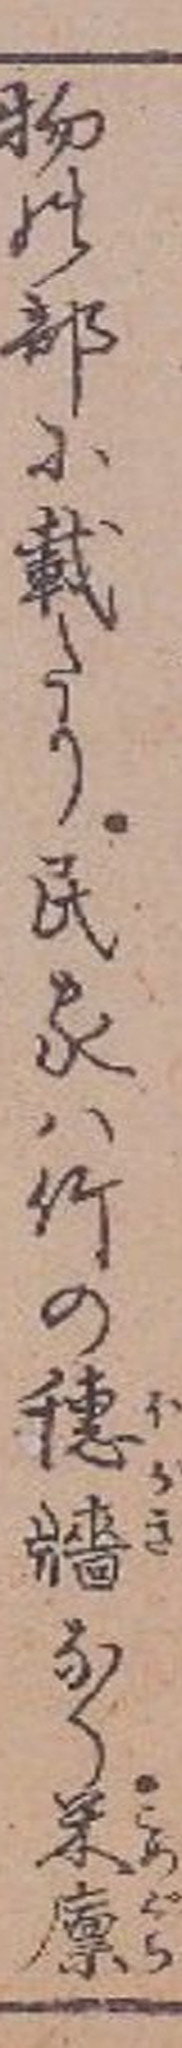物の部に載せたり•民家は竹の穂牆なり•米廩
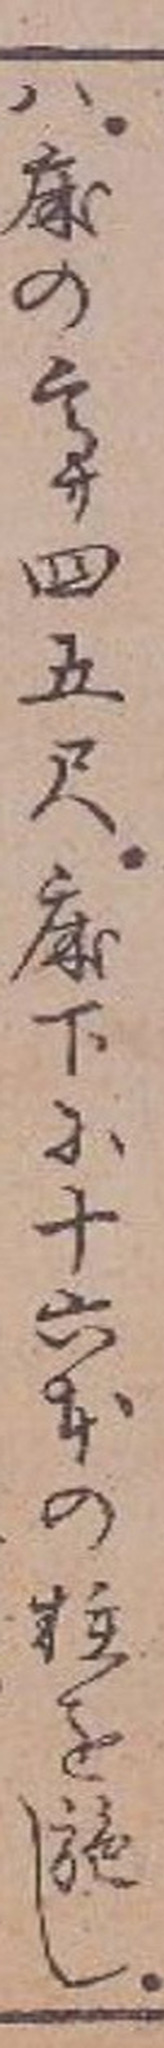は•床の高さ四五尺•床下に十六本の柱を施し•
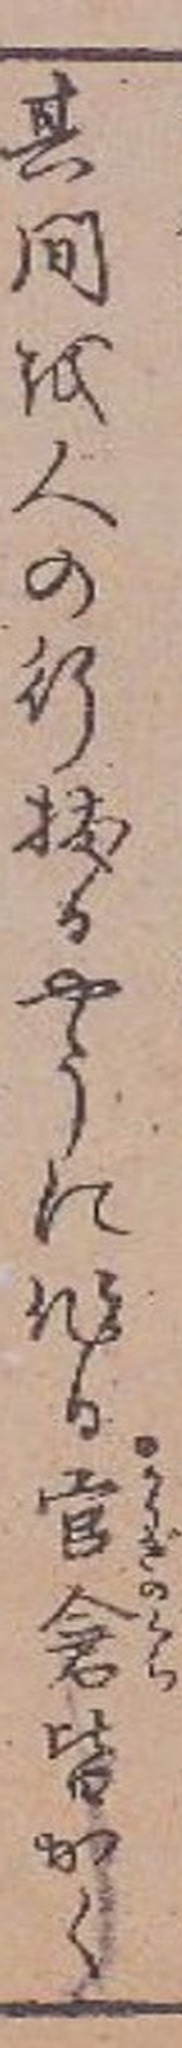其間を人の行抜るやうに作る•官倉皆かく
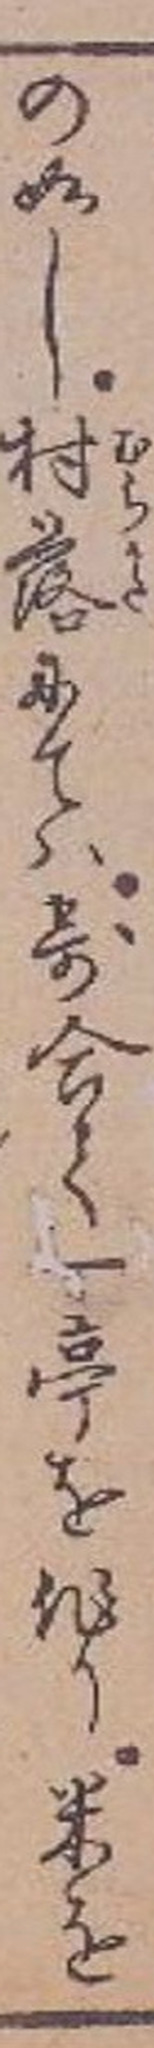の如し•村落にては•寄合て一亭を作り•米を
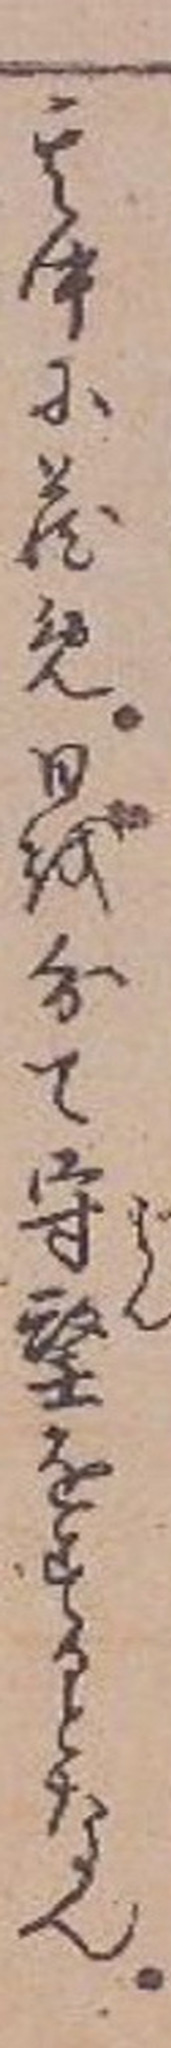其中に蔵め•日を分て守望をするとなん•
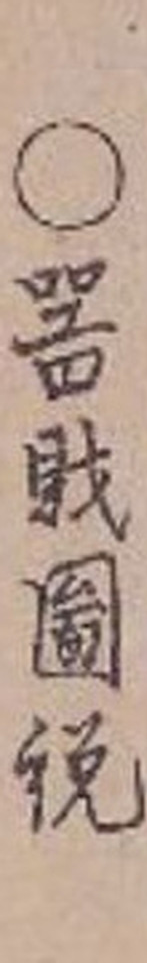〇器財図説
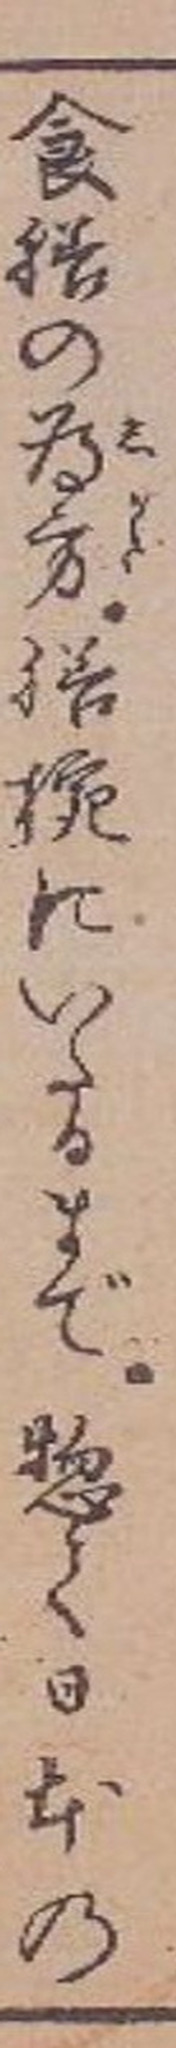食膳の為方•膳椀にいたるまで•惣て日本の
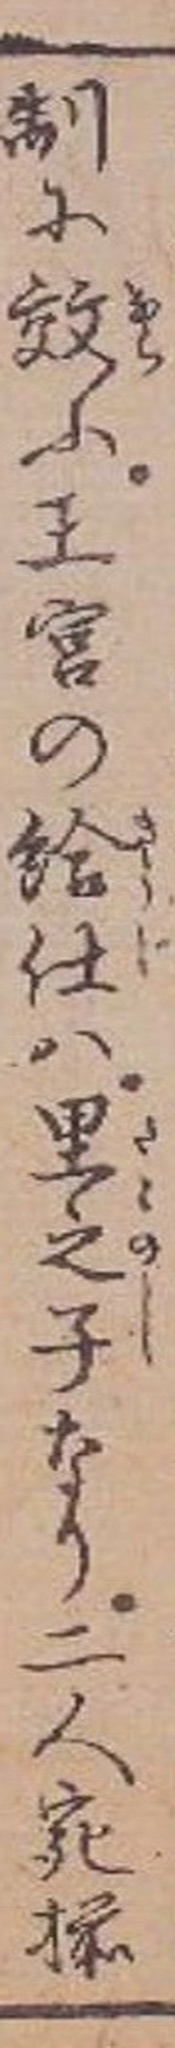制に效ふ•王宮の給仕は•里之子なり•二人宛揃
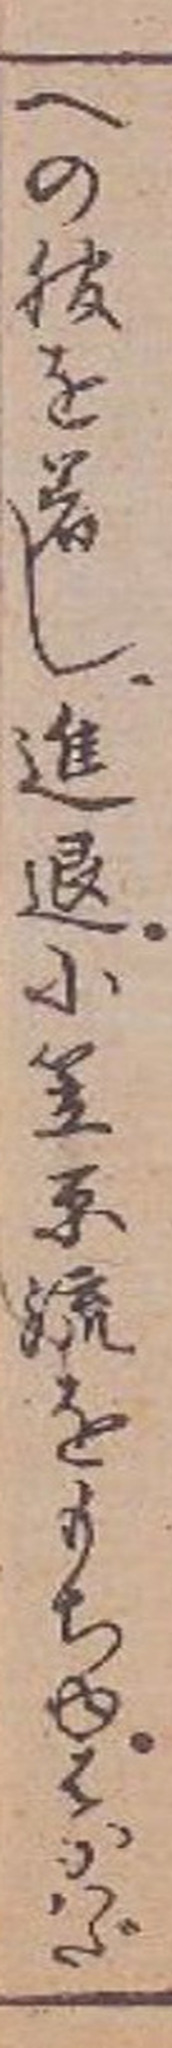への服を着し•進退•小笠原流をもちゆ•はなはだ
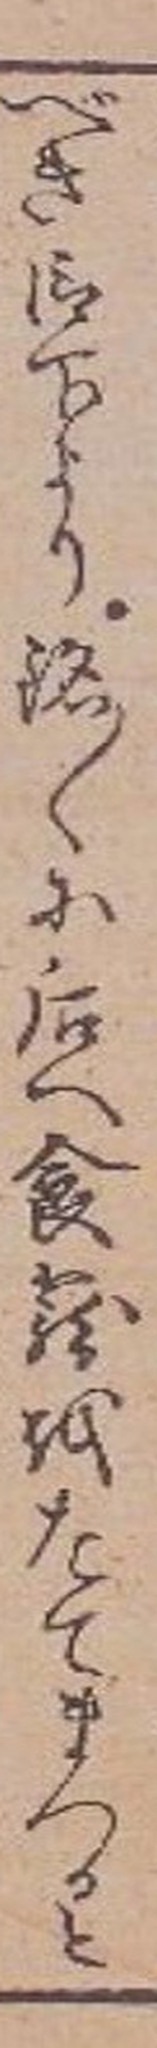べき臣下より•銘〳〵后へ食籠をたてまつると
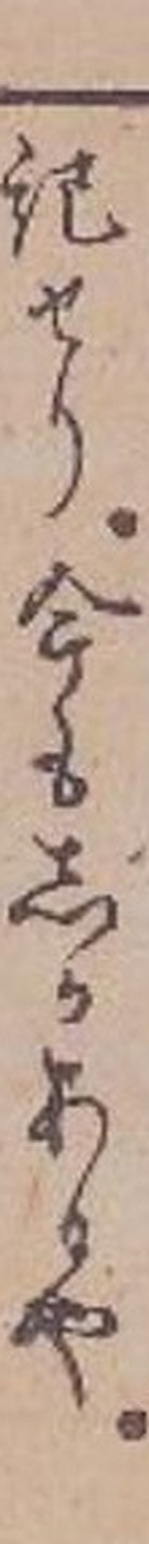記せり•今もしかあるや•
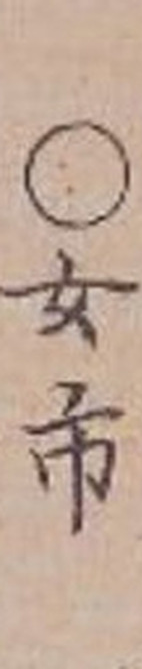〇女市
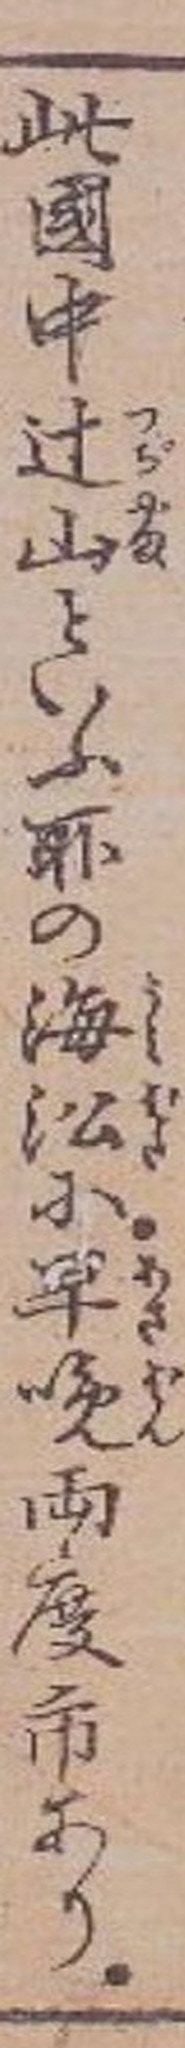此国中辻山といふ所の海沿に•朝晩両度市あり•
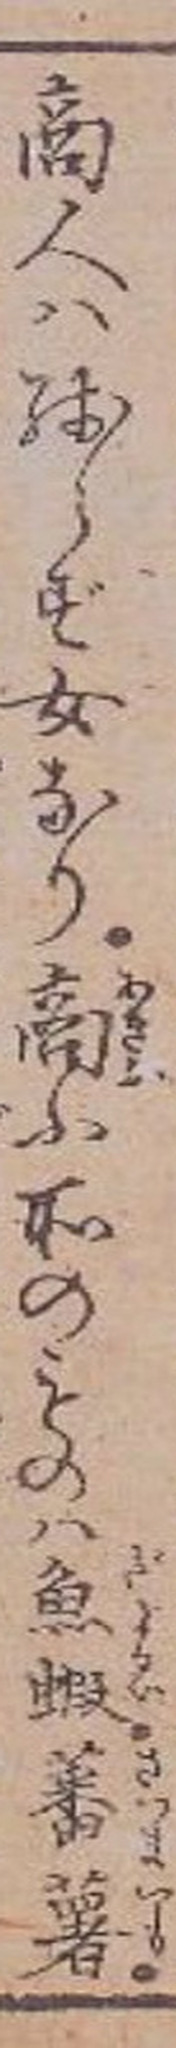商人は残らず女なり•商ふ所のものは魚蝦•蕃薯•
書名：琉球談
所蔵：University of the Ryukyus Library
